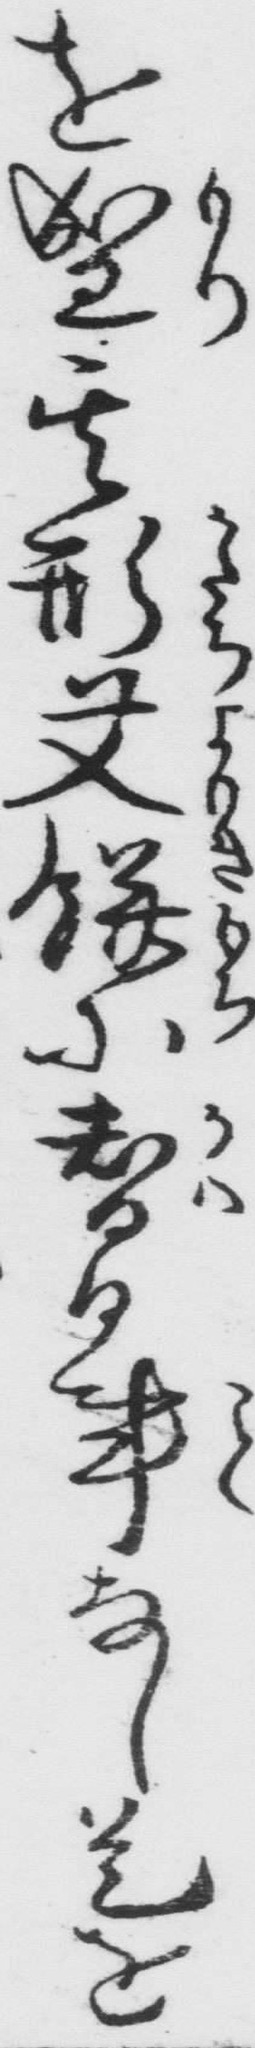を盛其形艾餅に替る事なし是を
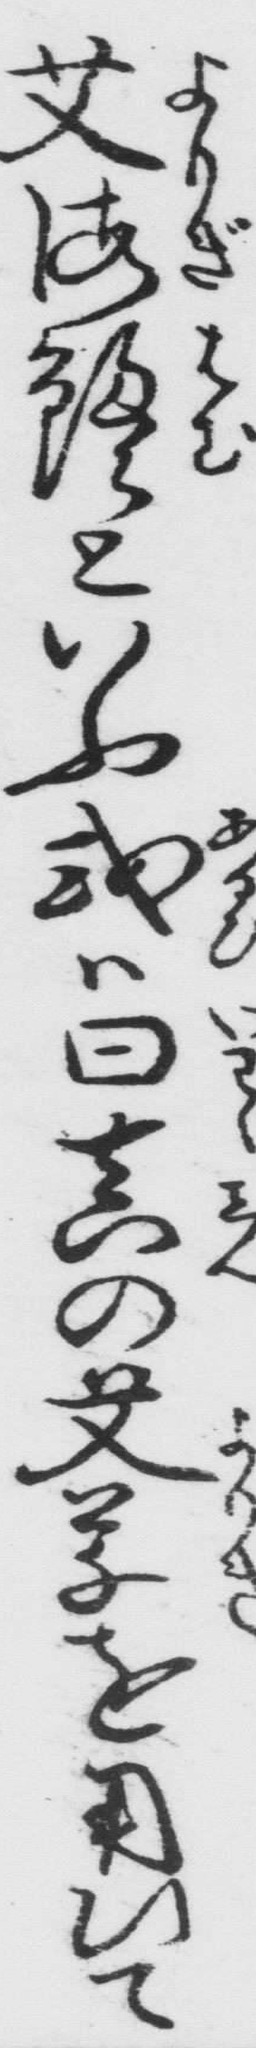艾海鱧といふ或は曰真の艾草を用ひて
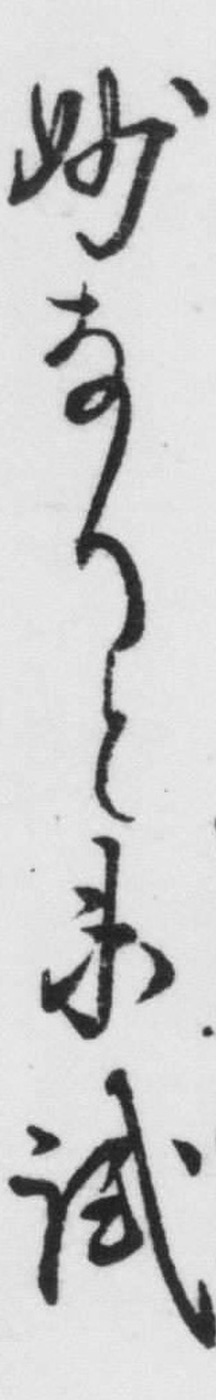妙なりと未試
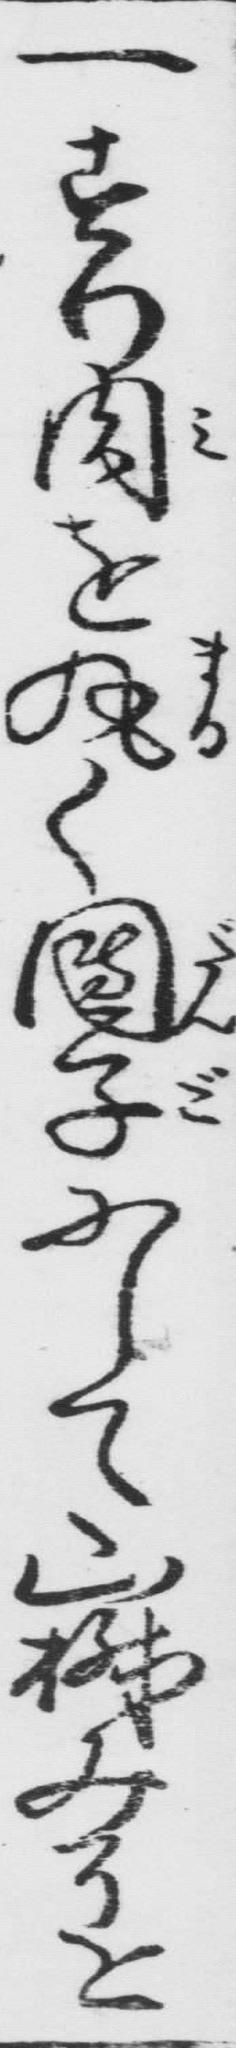一すり肉を丸く團子にして山椒みそを
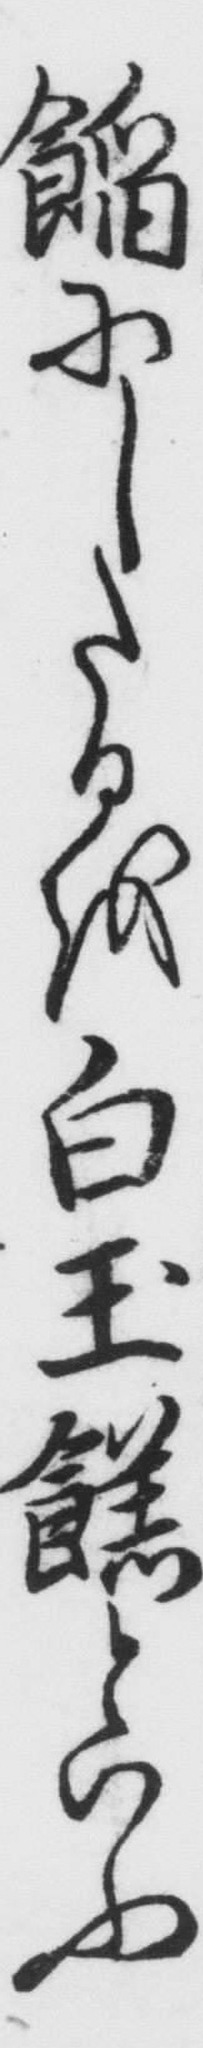餡にしたるを白玉糕といふ
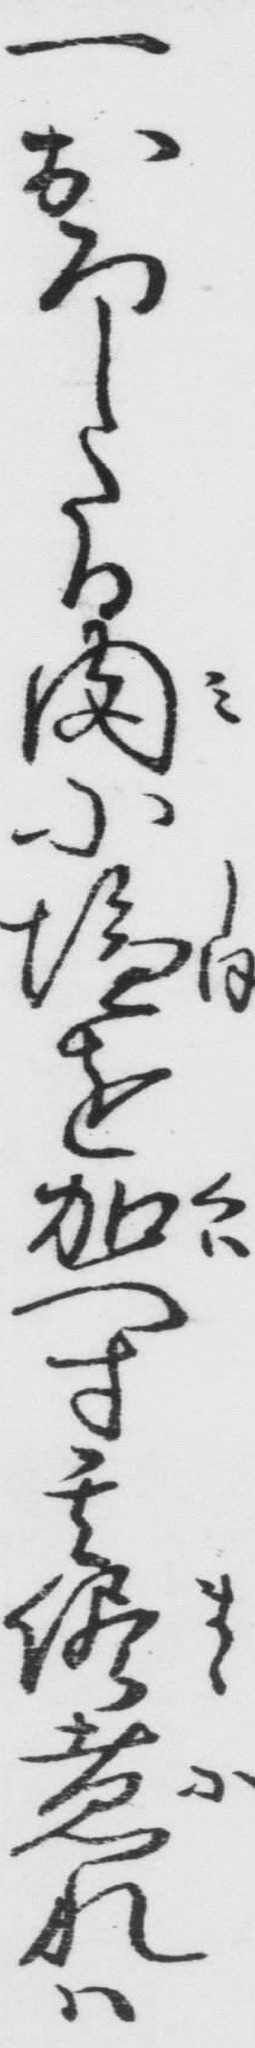一おろしたる肉に塩を加へす其儘煮れは
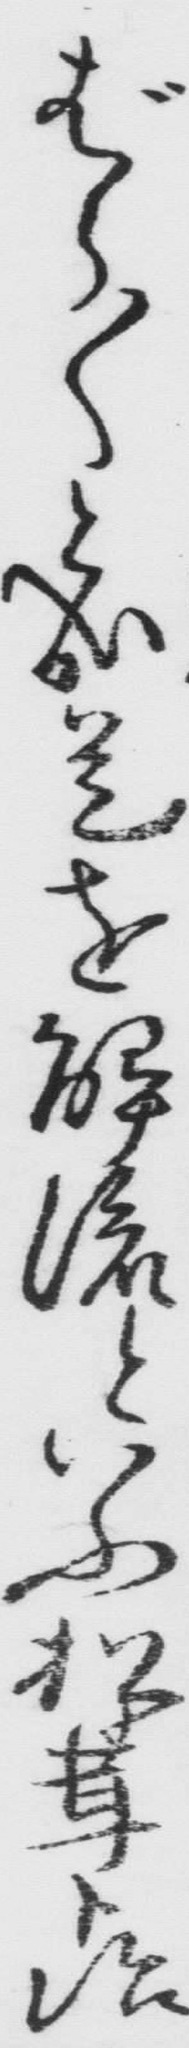ばら〳〵と成是を解流といふ松茸〆治
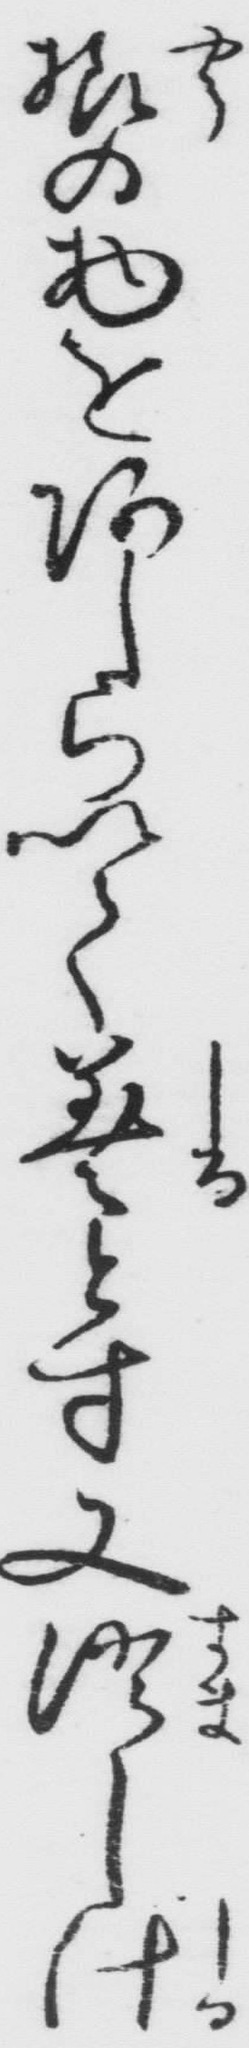様の物をあしらいて羹とす又澄し汁
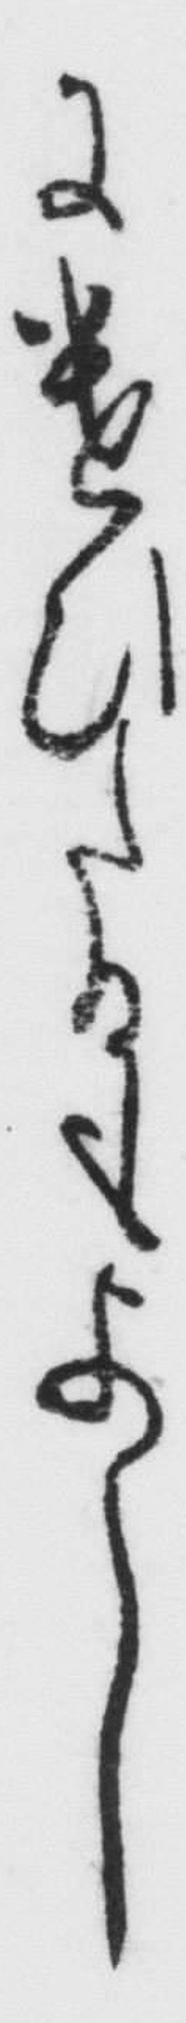に遣ひたるもよし
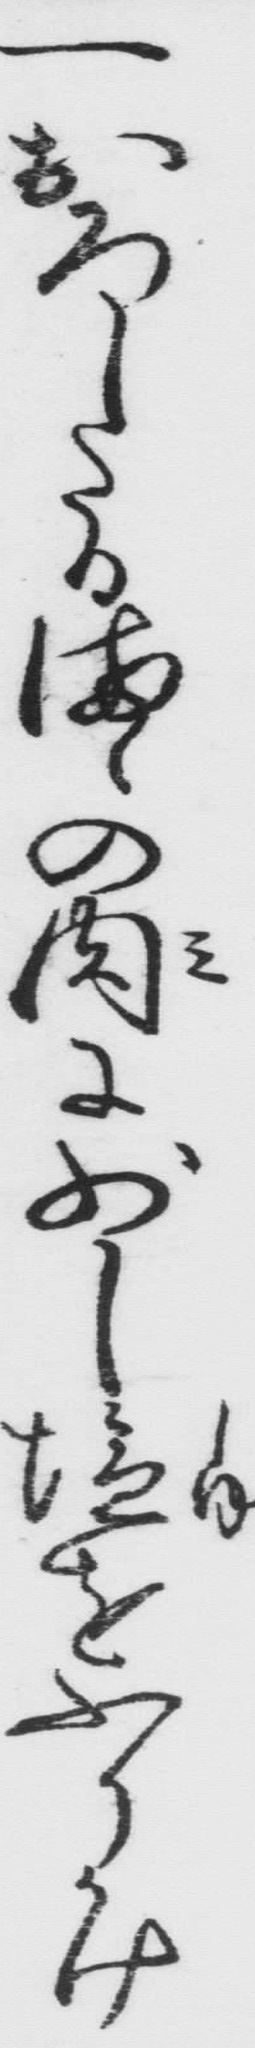一おろしたるまゝの肉に少し塩をふりかけ

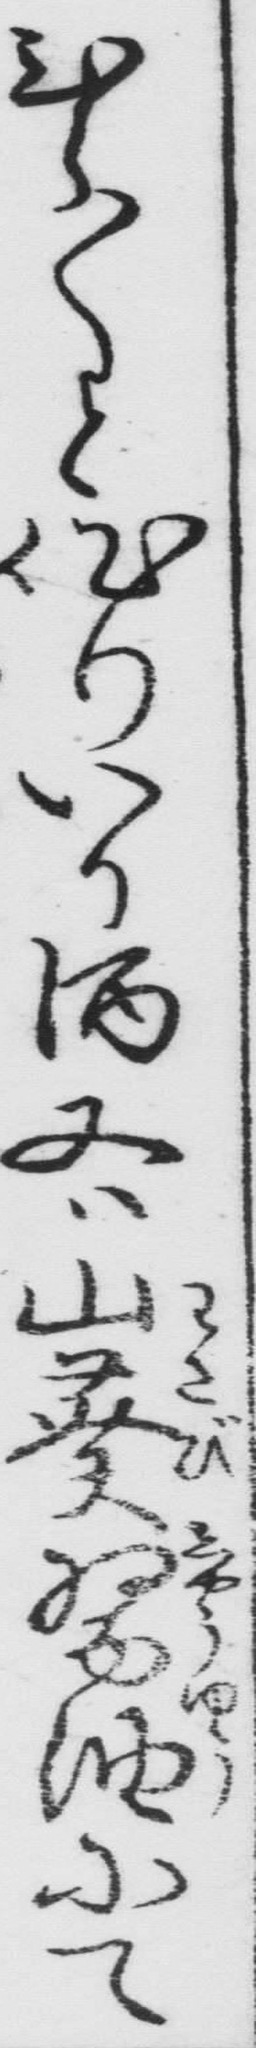ひら〳〵と作りいり酒又は山葵醤油にて
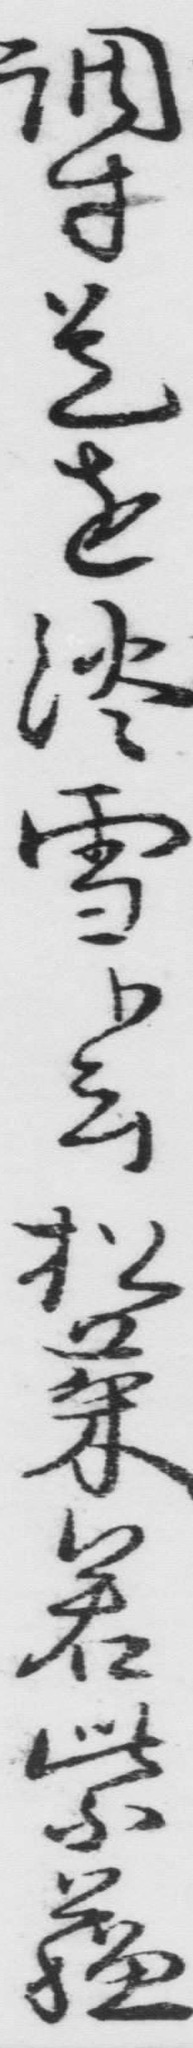調す是を淡雪と云松菜若紫蘇
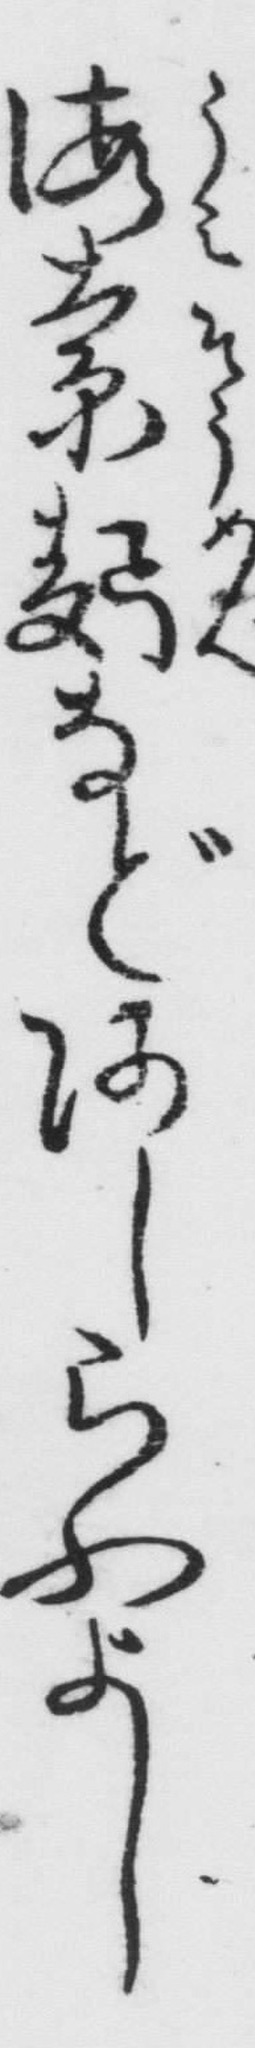海素麺などあしらふよし
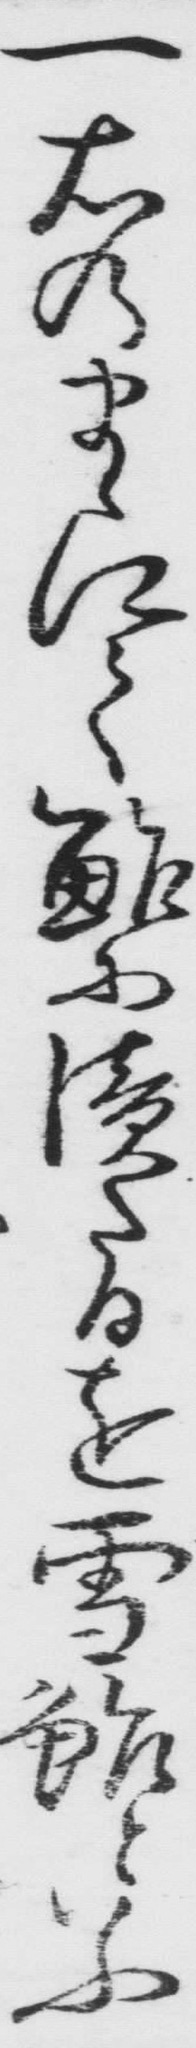一右のまゝにて鮓に漬たるを雪鮓といふ
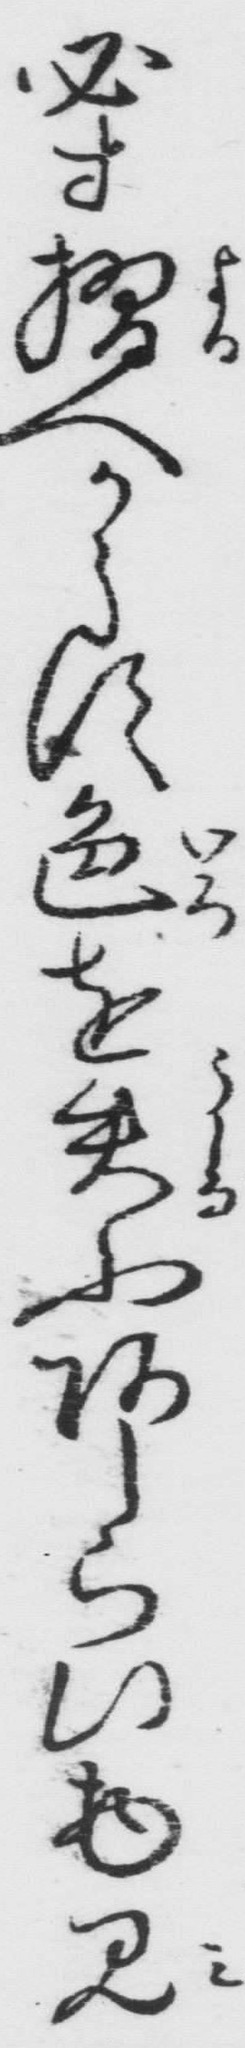必す摺へからす色を失ふあしらい物見
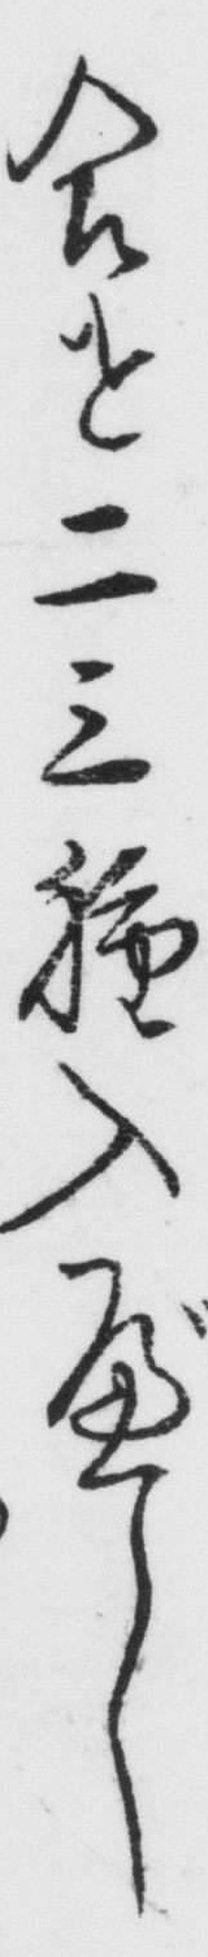合を二三種入べし
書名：海鰻百珍
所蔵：大阪府立大学学術情報センター 国文学研究資料館
